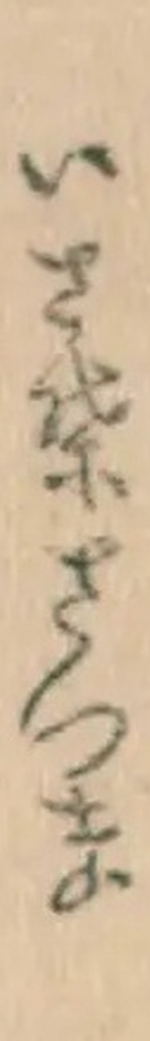いさ葉さつま

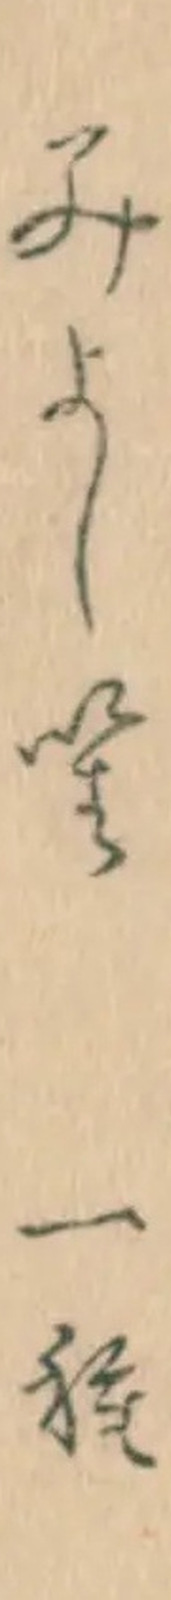みよし野一種
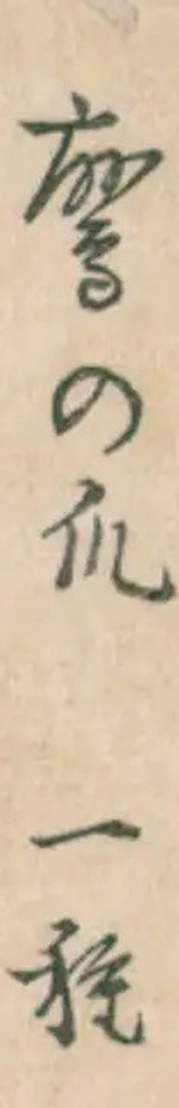鷹の爪一種

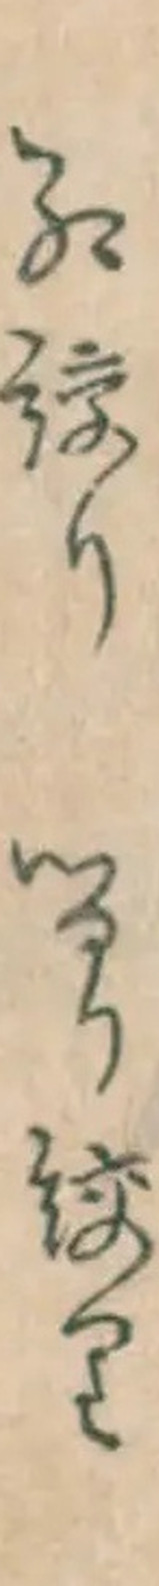紅絞りるり絞り
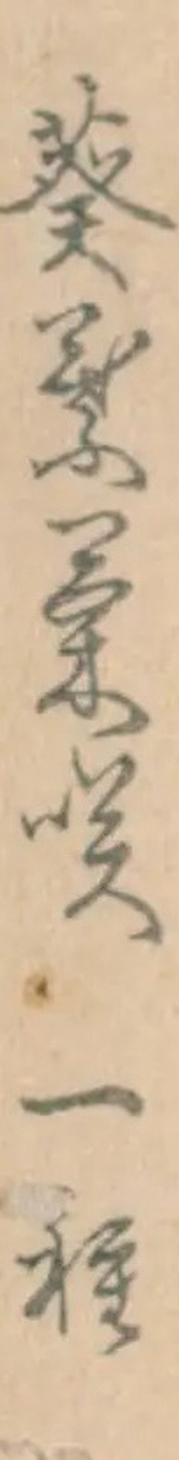葵葉菊咲一種

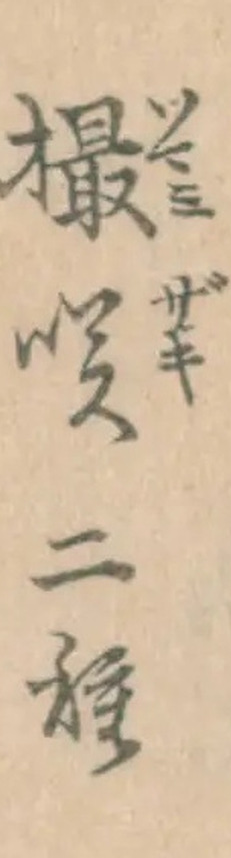撮咲二種
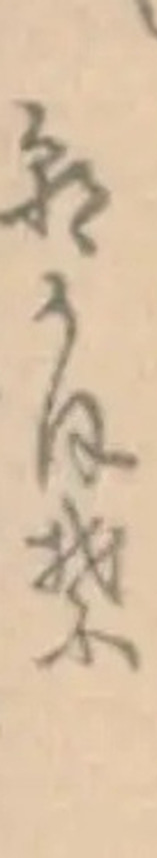朝かほ葉
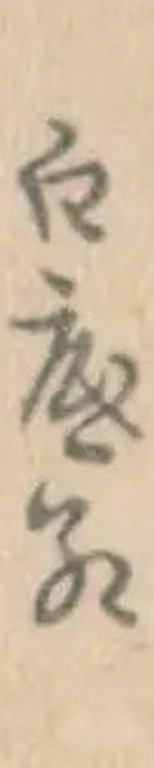白底紅

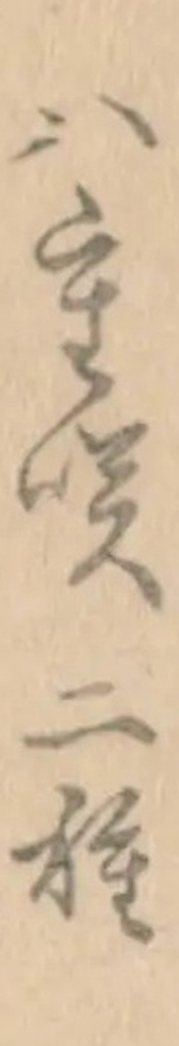八重咲二種
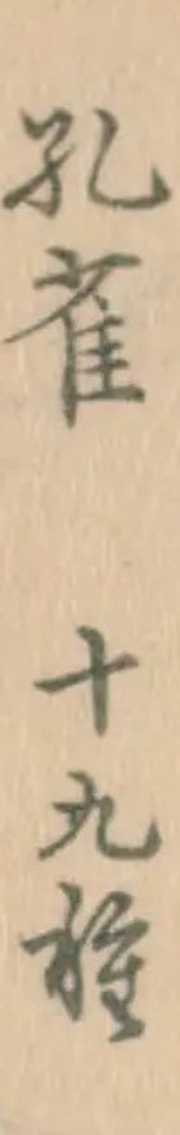孔雀十九種
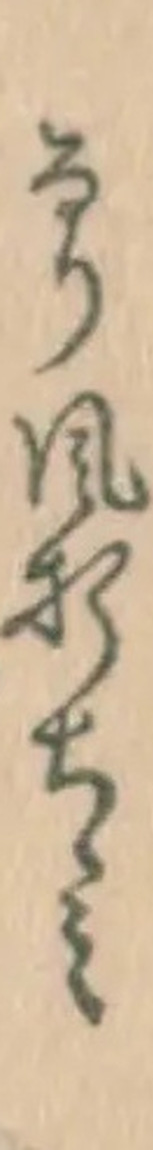るり風折ちゝみ
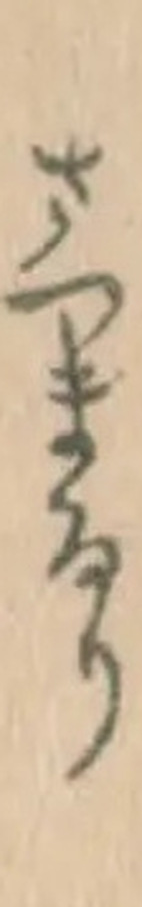さつまるり
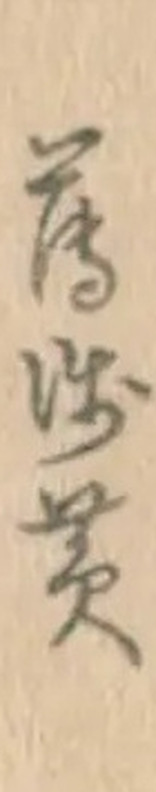薄浅黄
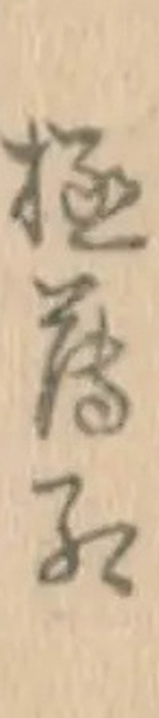極薄紅
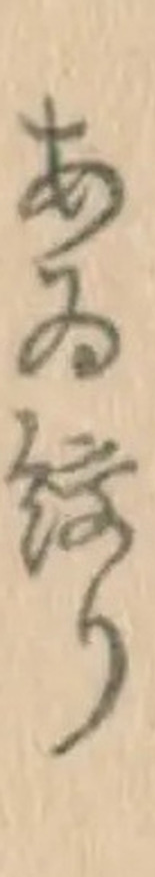あゐ絞り
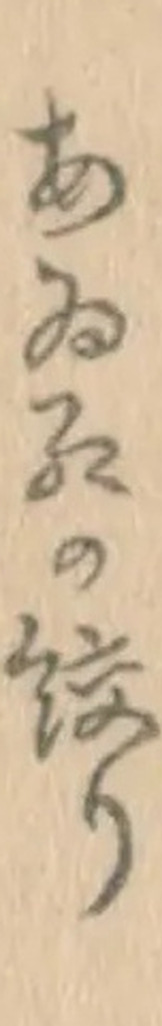あゐ紅の絞り
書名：朝顔叢. 上巻
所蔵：国立国会図書館 National Diet Library, JAPAN
